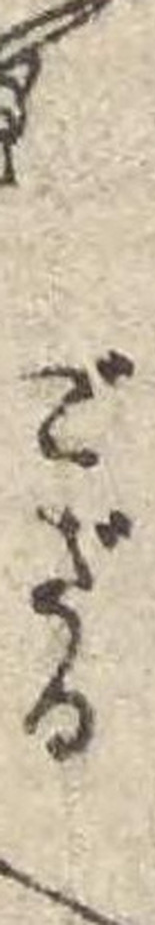ござる
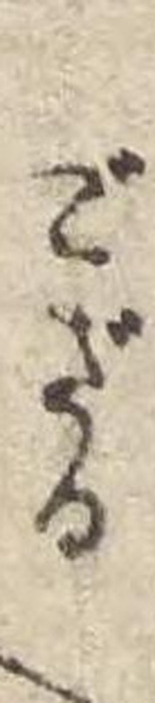ござる
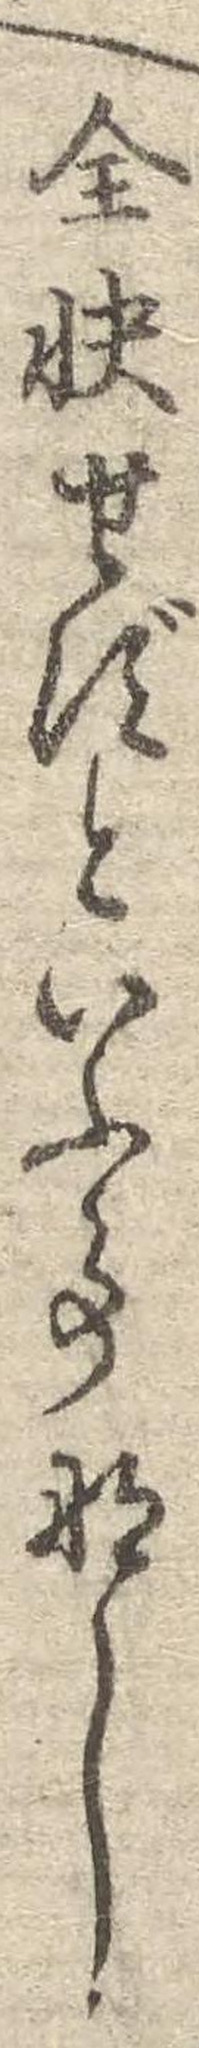全快せずといふ事なし
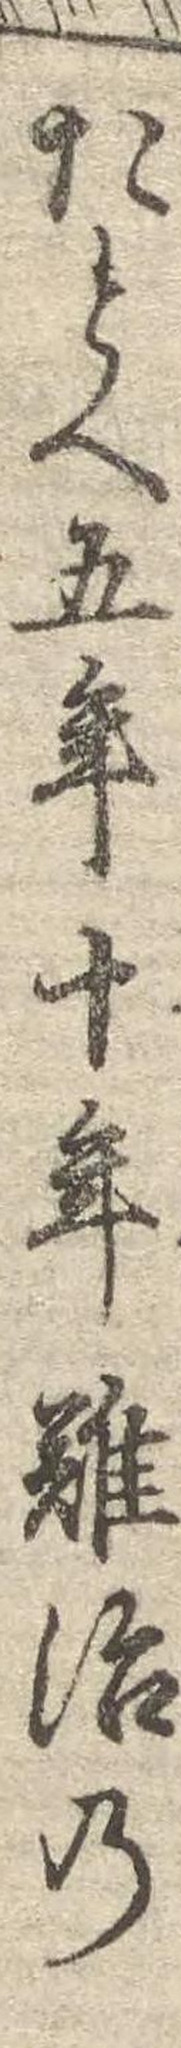たとへ五年十年難治の
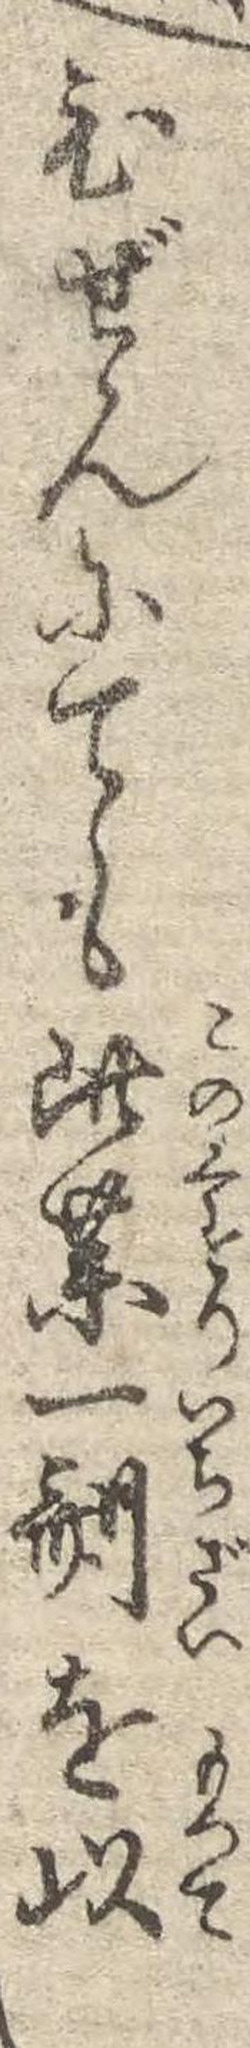ひぜんにても此薬一剤を以
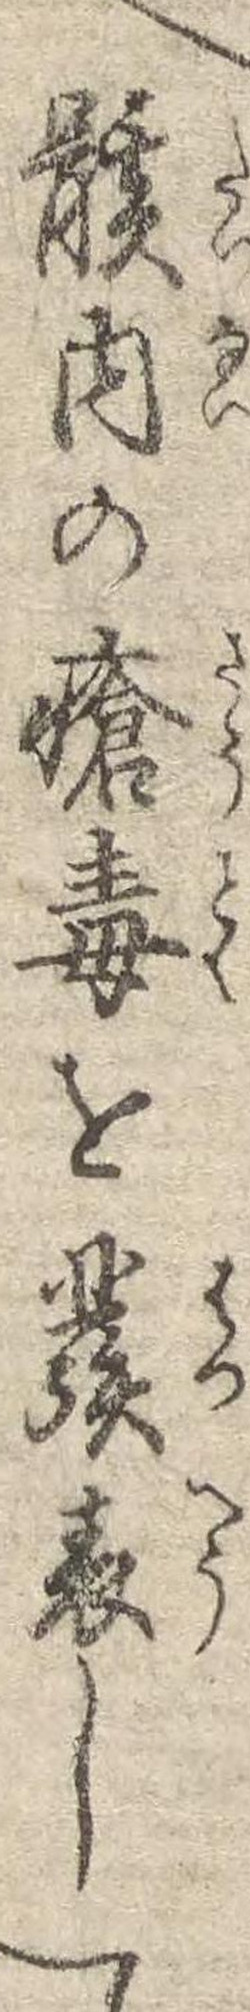骸内の瘡毒を発表し
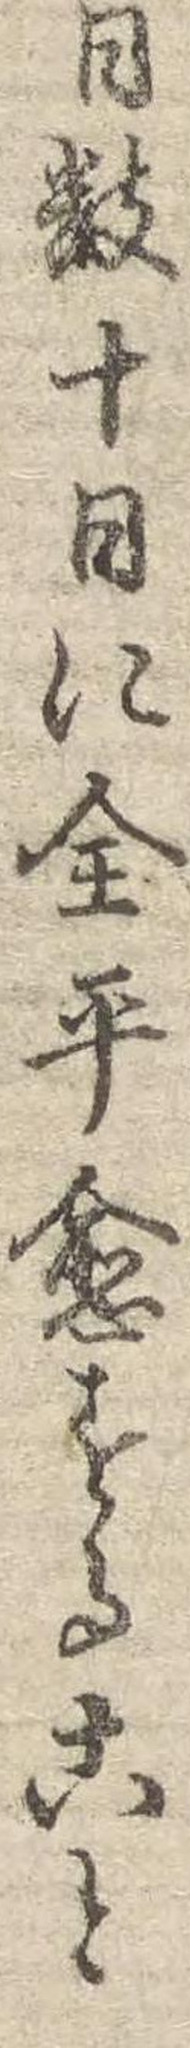日数十日に全平愈すること
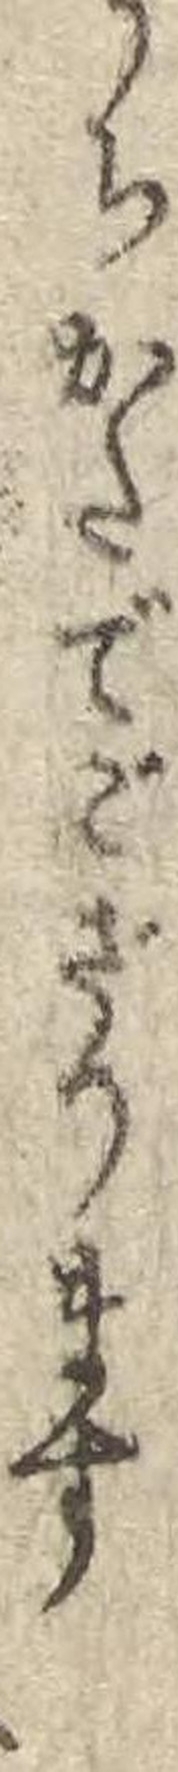うちかたでござります
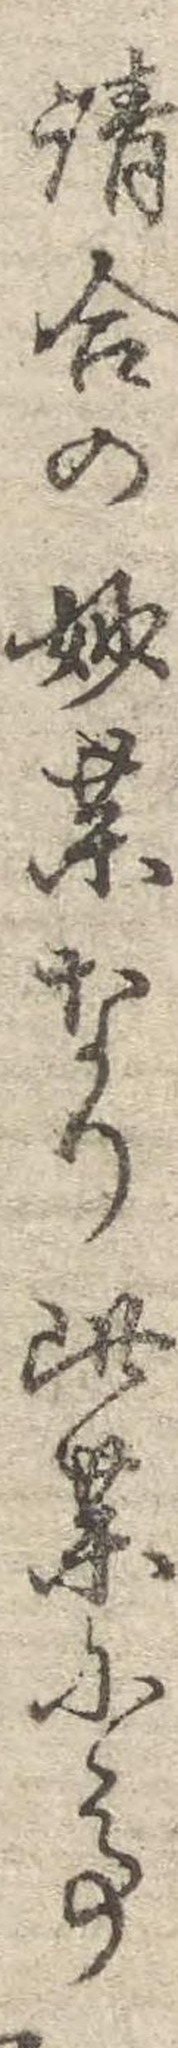請合の妙薬なり此薬にて
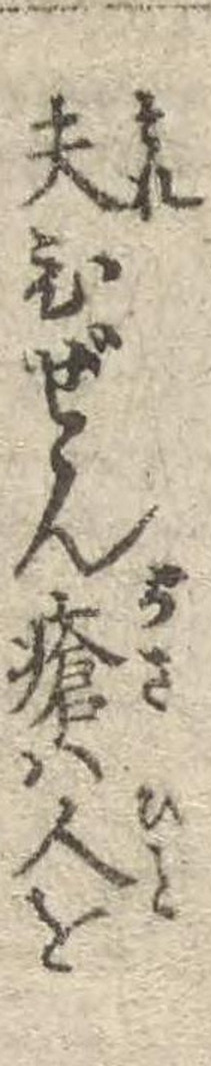夫ひぜん瘡は人を
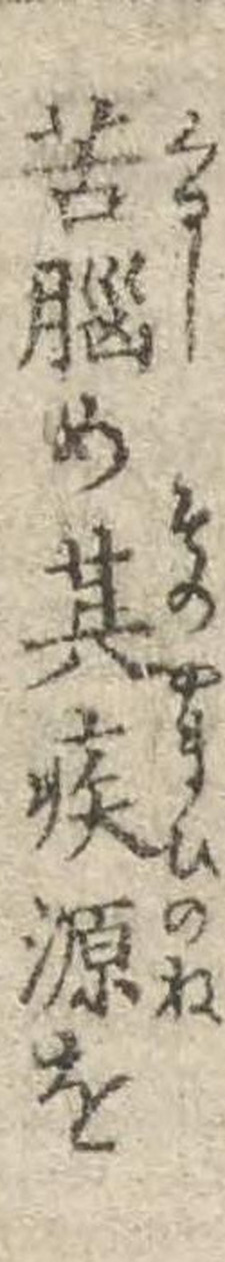苦脳め其疾源を
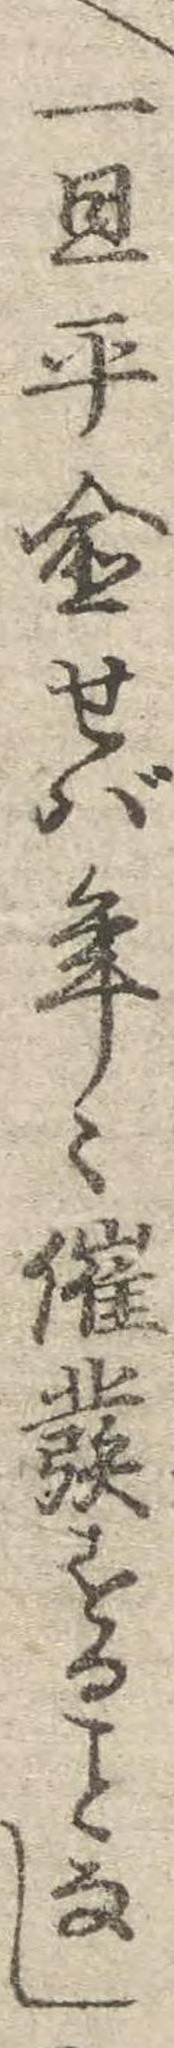一旦平愈せば年々催発することなし
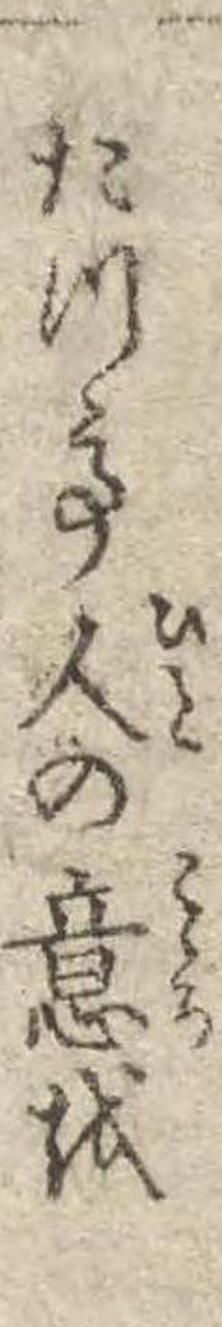たつて人の意を
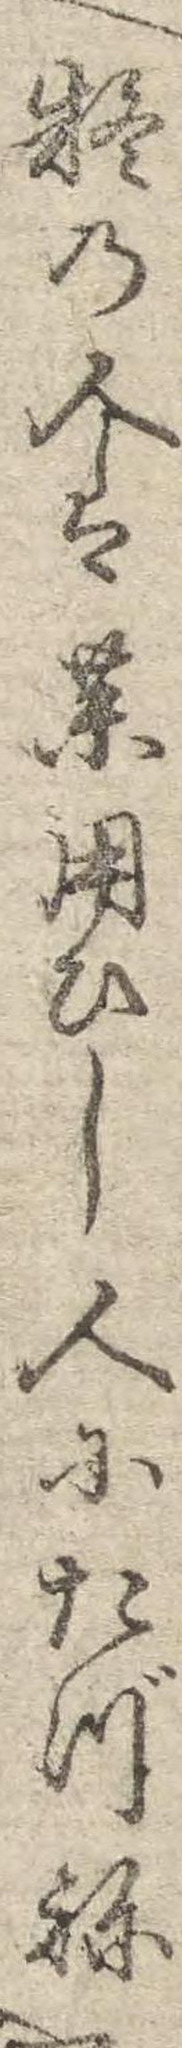疑の人は薬用ひし人にたづね
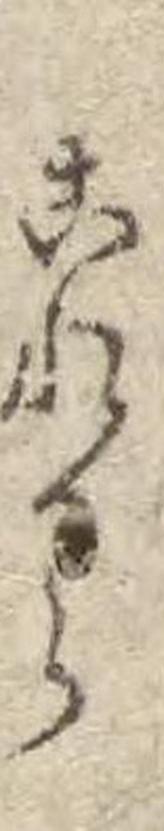これから
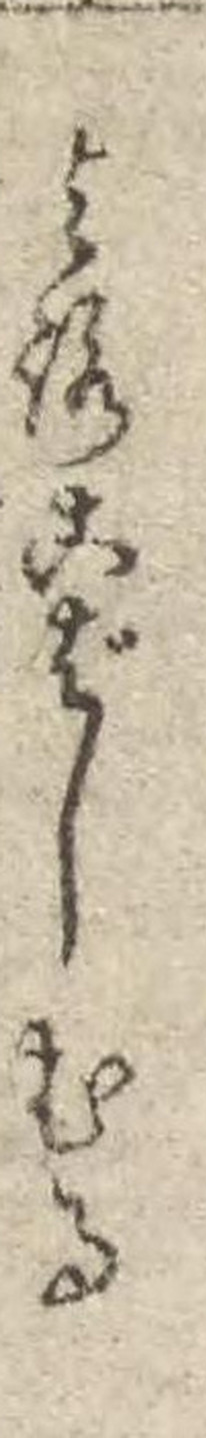よろこばしむる
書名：浪華薬種問屋能書張交帖. 一
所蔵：国立国会図書館 National Diet Library, JAPAN
